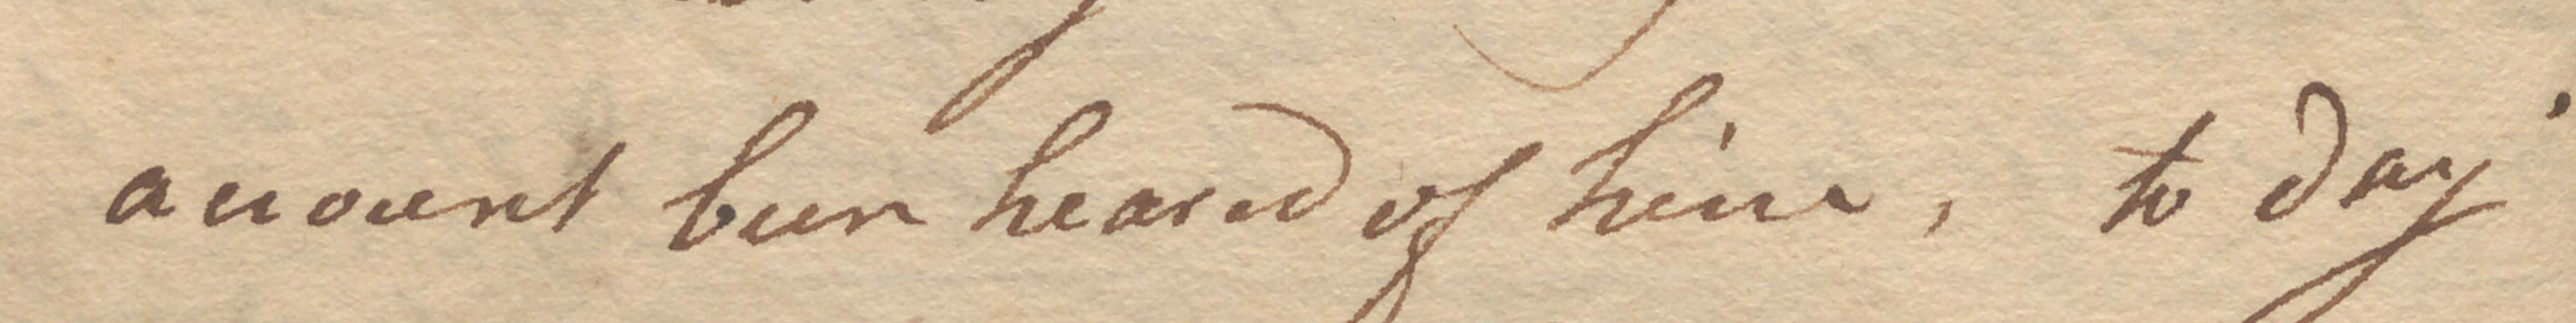account been heared of him, to day
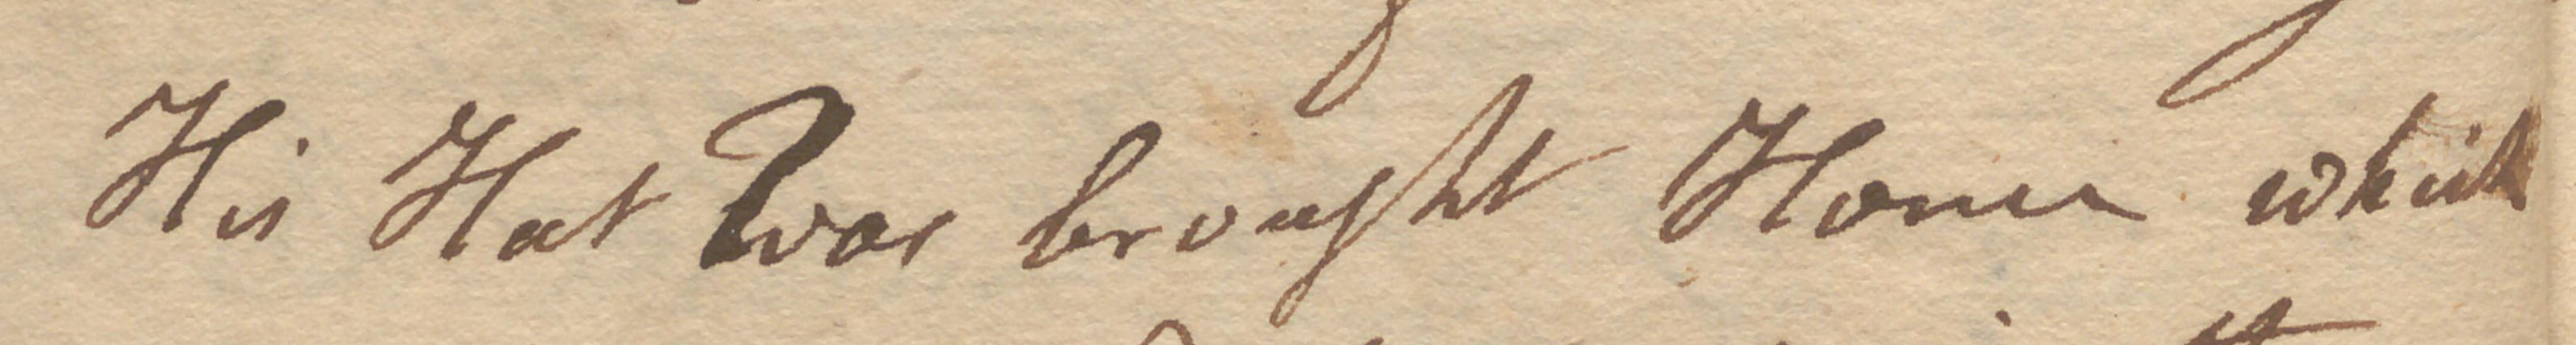His Hat was brought Home which
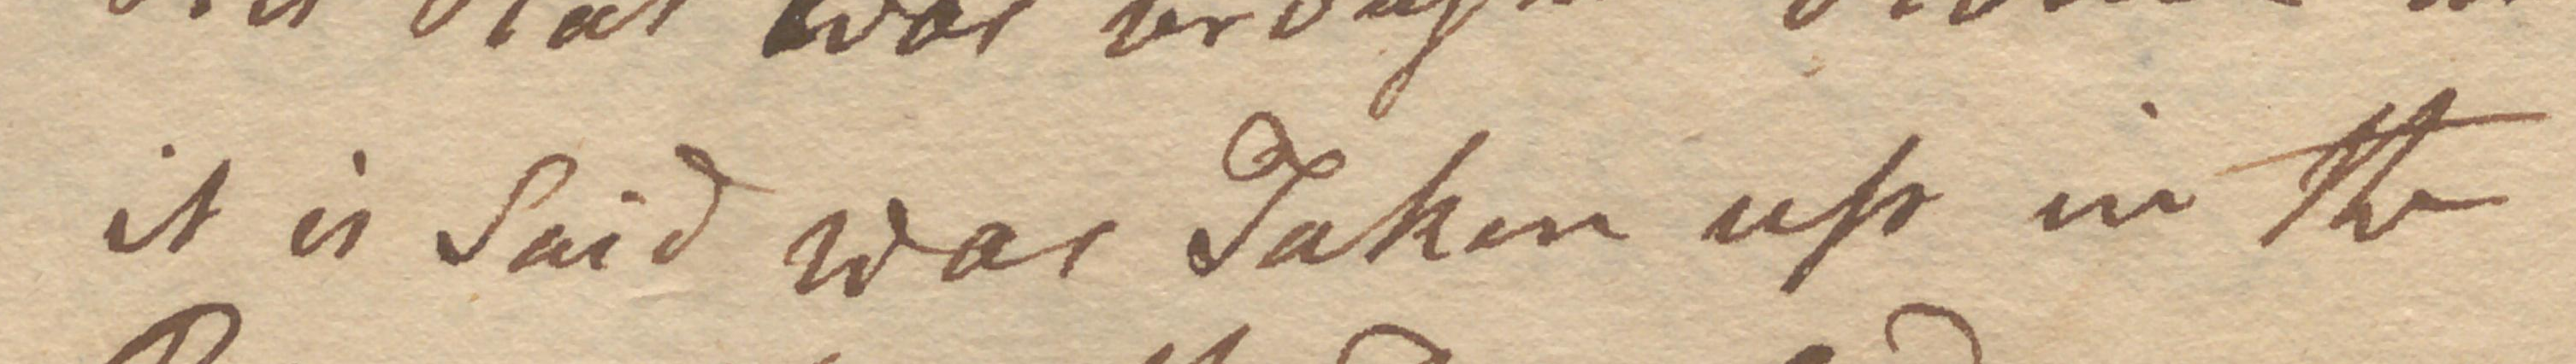it is said was Taken up in the
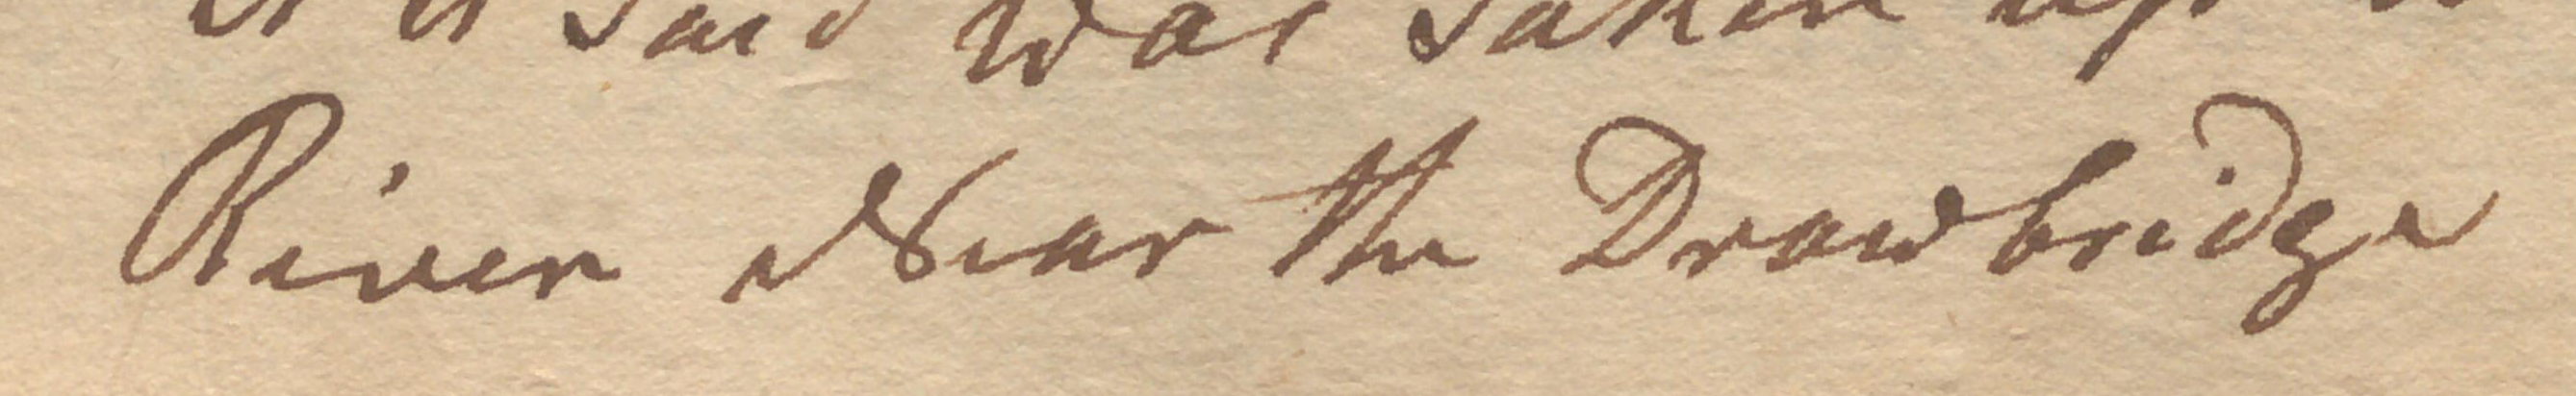River Near the Drawbridge
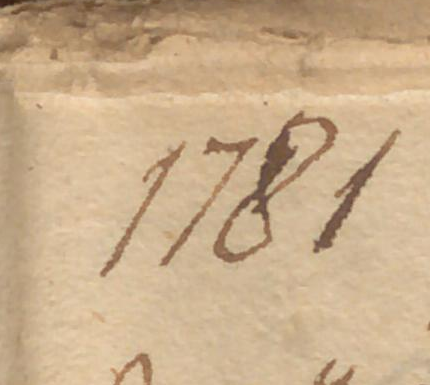1781
